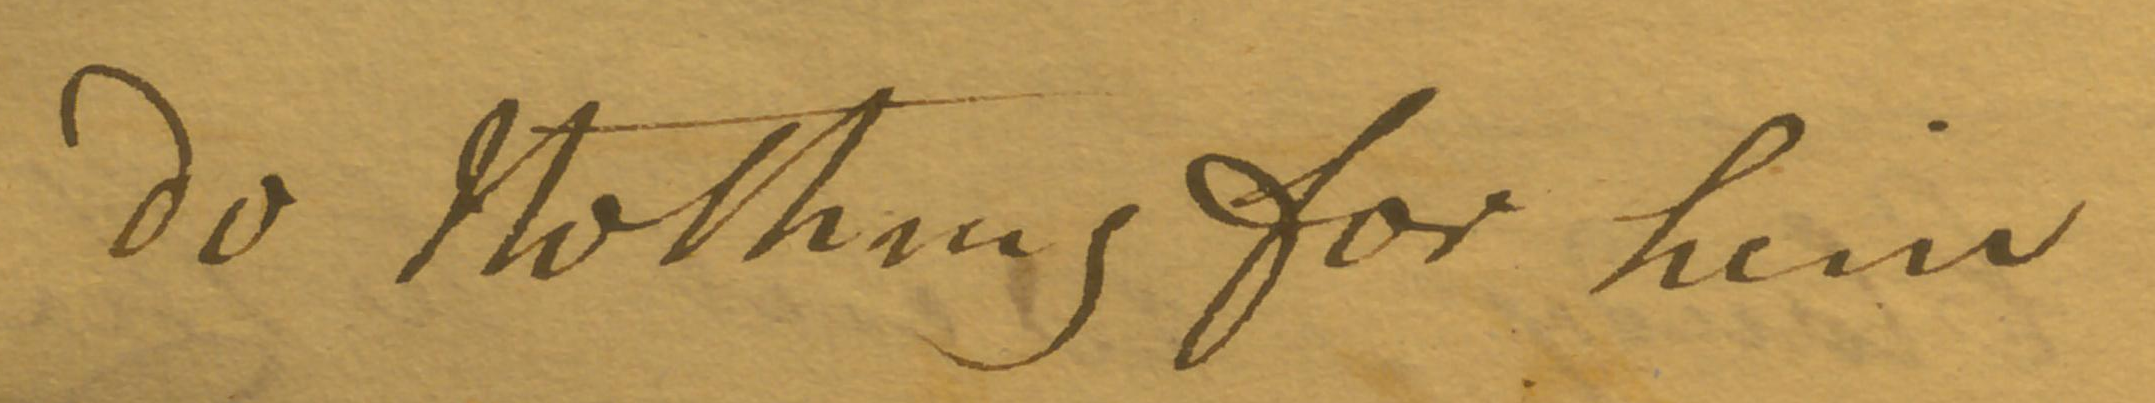do Nothing for him
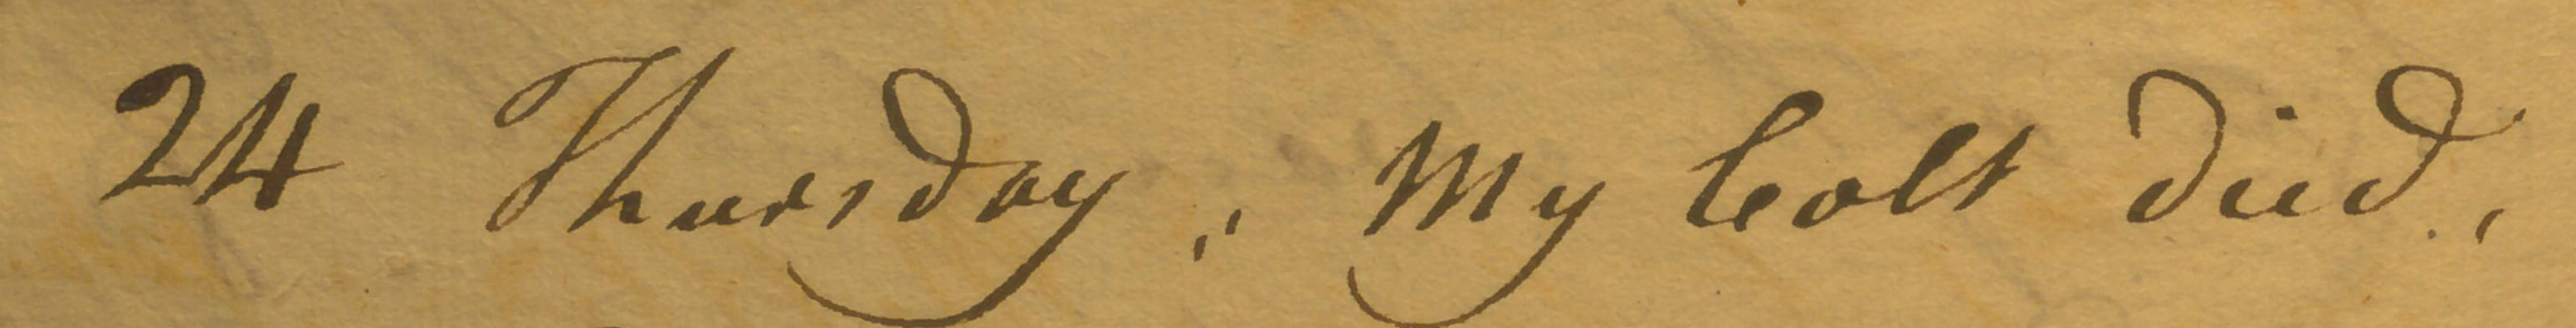24 Thursday. My Colt died.
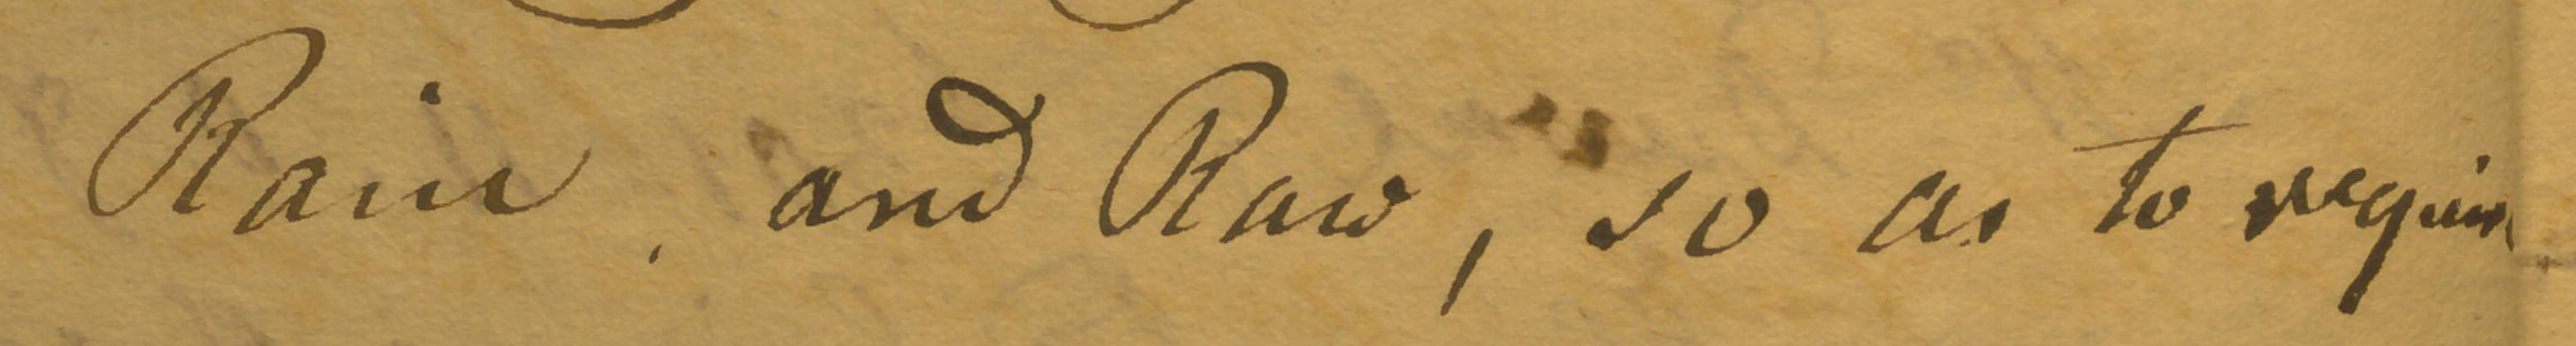Rain and Raw, so as to reequen
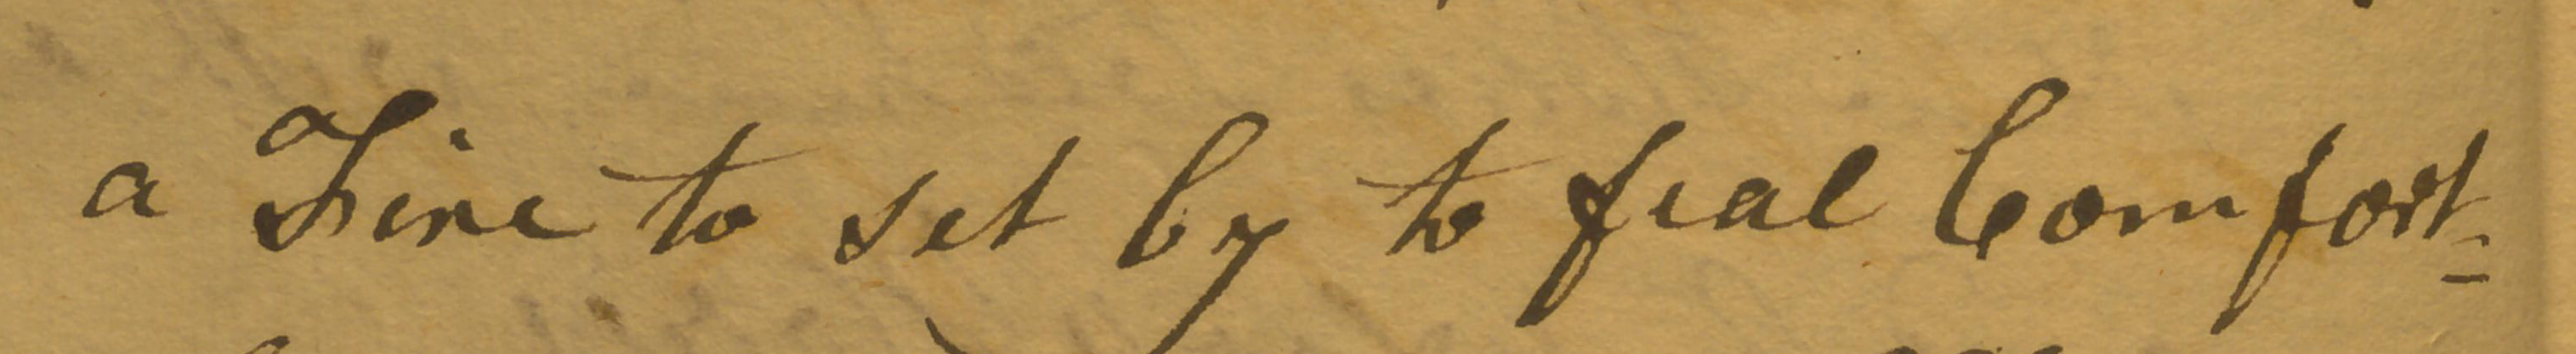a Fire to set by to feal Comfort
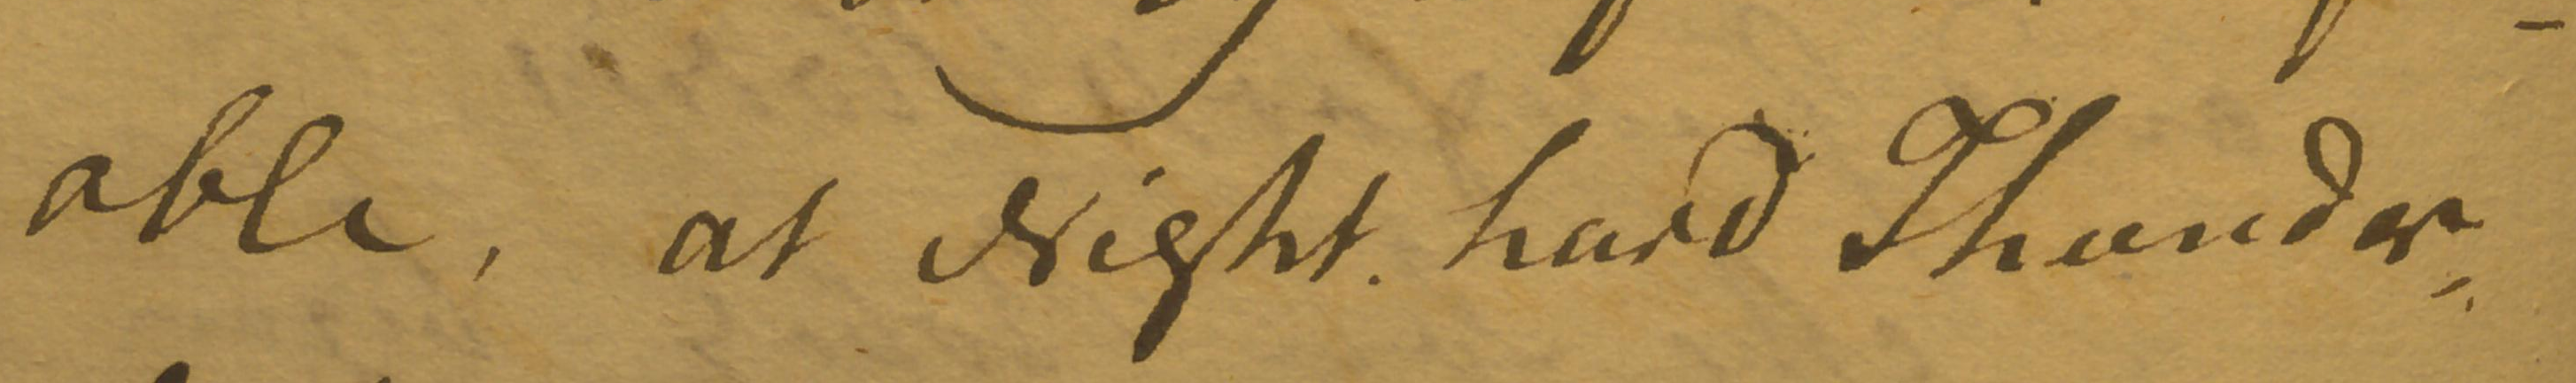able, at Night hard Thunder
